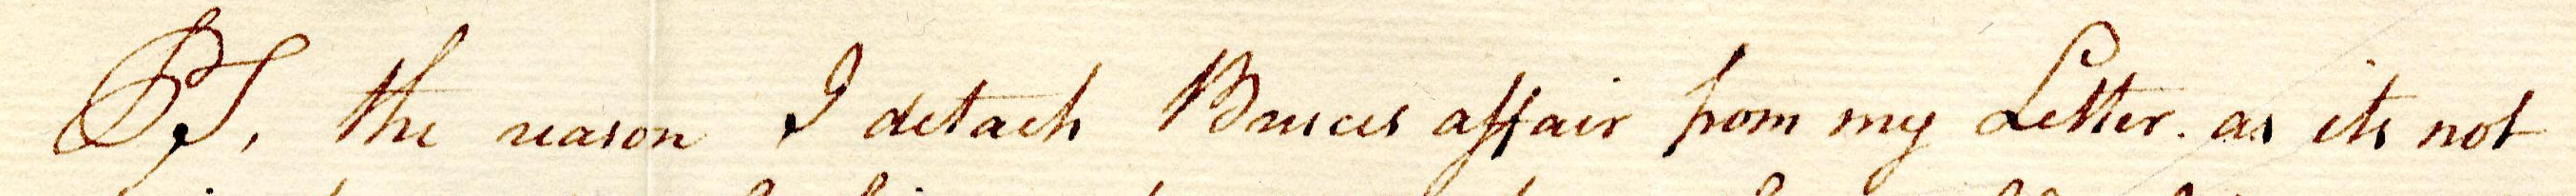PS. the reason I detach Bruces affair from my Letter, as its not
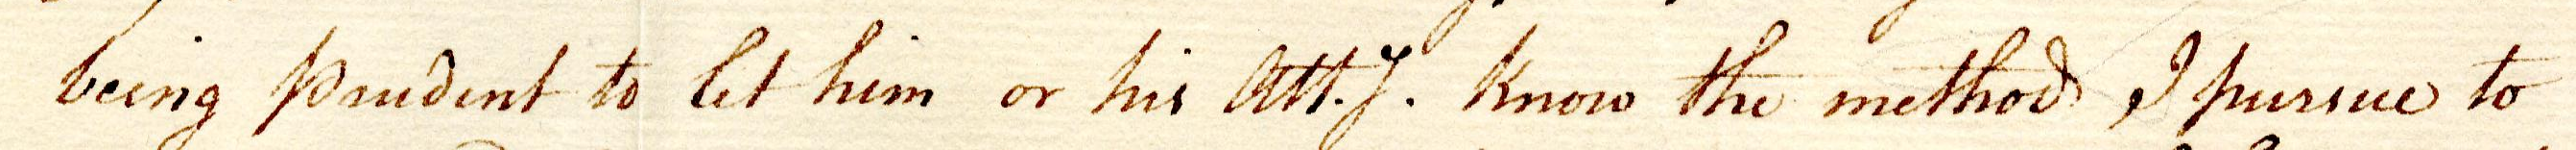being prudent to let him or his Att^y. know the method I pursue to
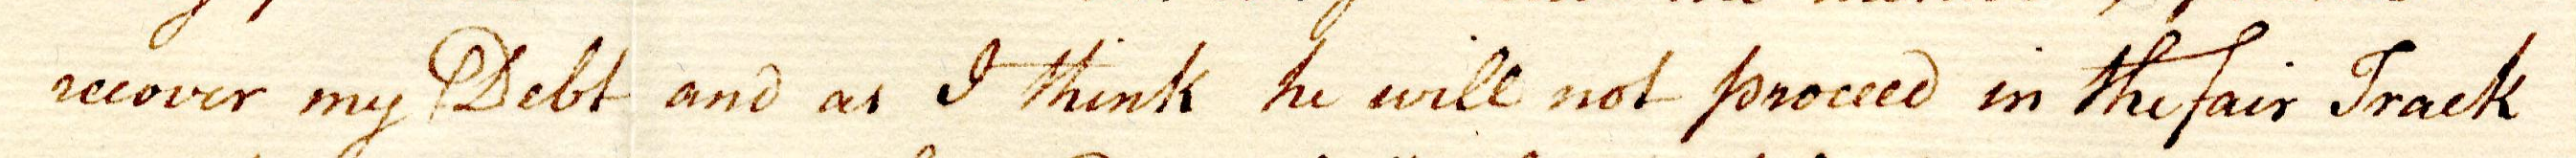recover my Debt and as I think he will not proceed in the fair Track
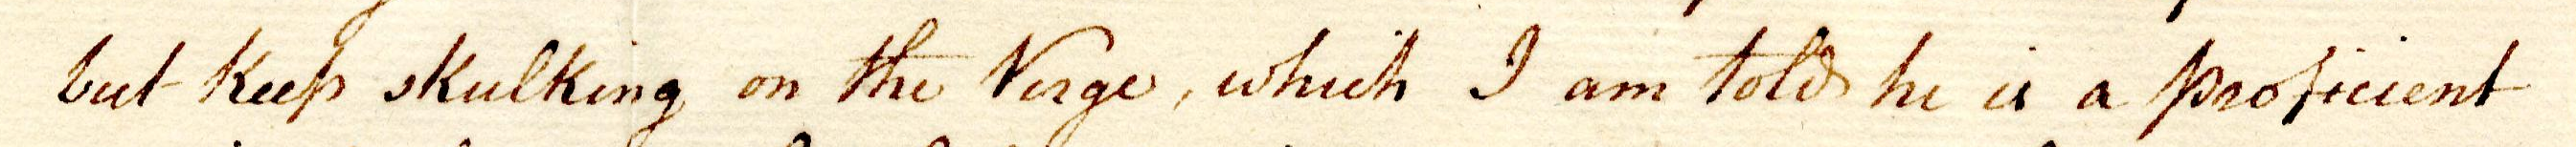but keep skulking on the Verge, which I am told he is a proficient
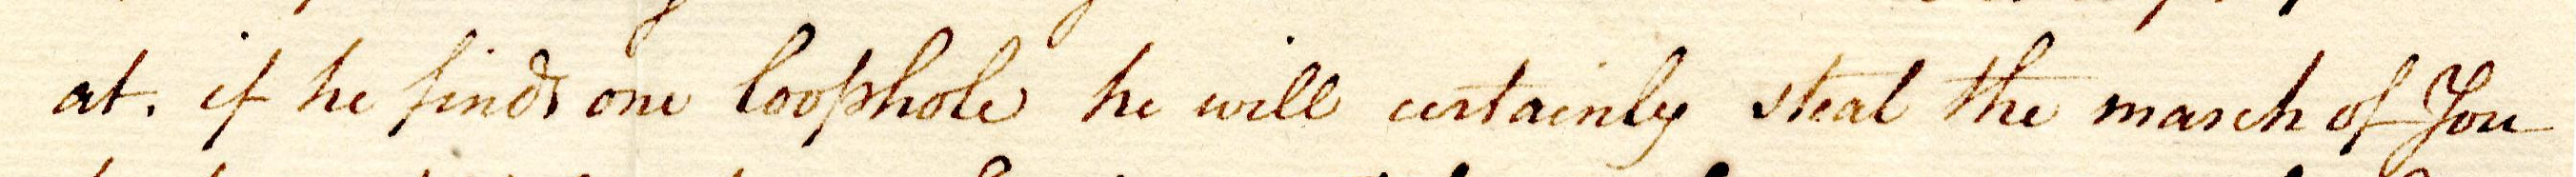at if he finds one loophole he will certainly steal the march of You
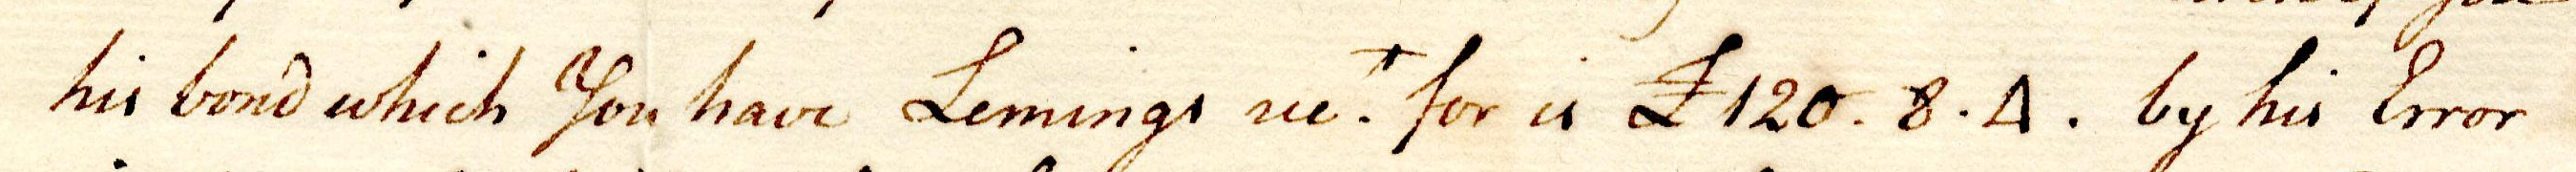his bond which You have Lemings rec^t. for is £120.8.4. by his Error
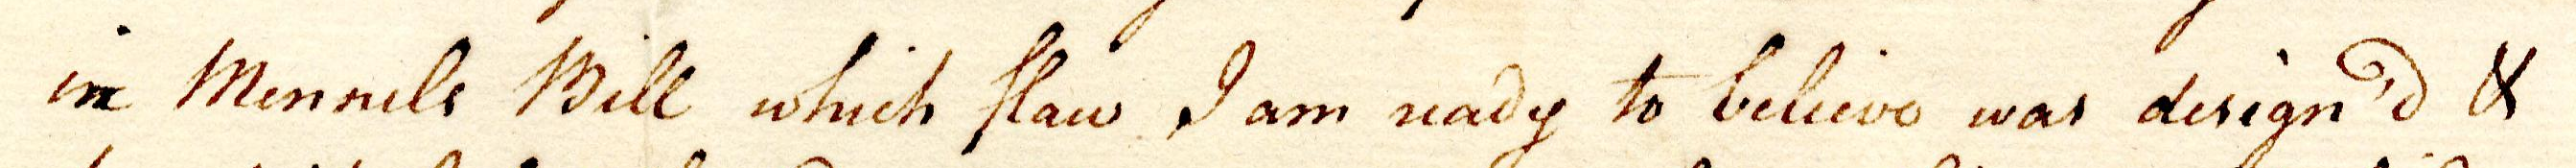in Mennels Bill which flaw I am ready to believe was design'd &
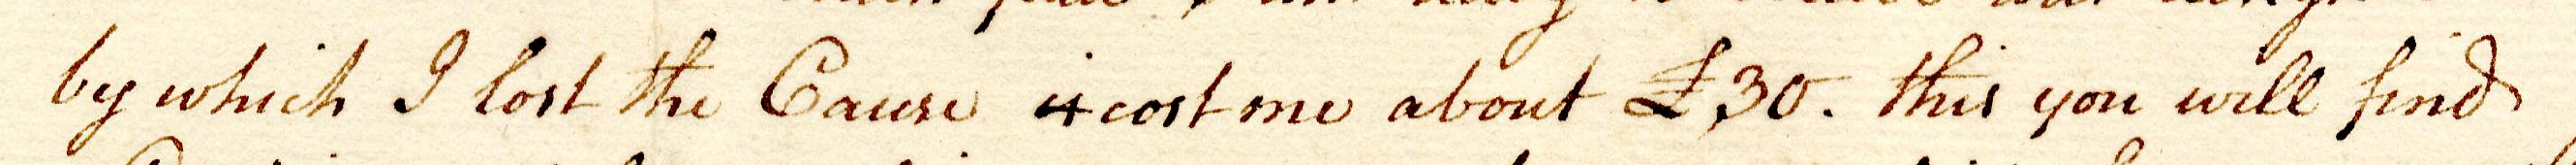by which I lost the Cause it cost me about £30. this you will find
